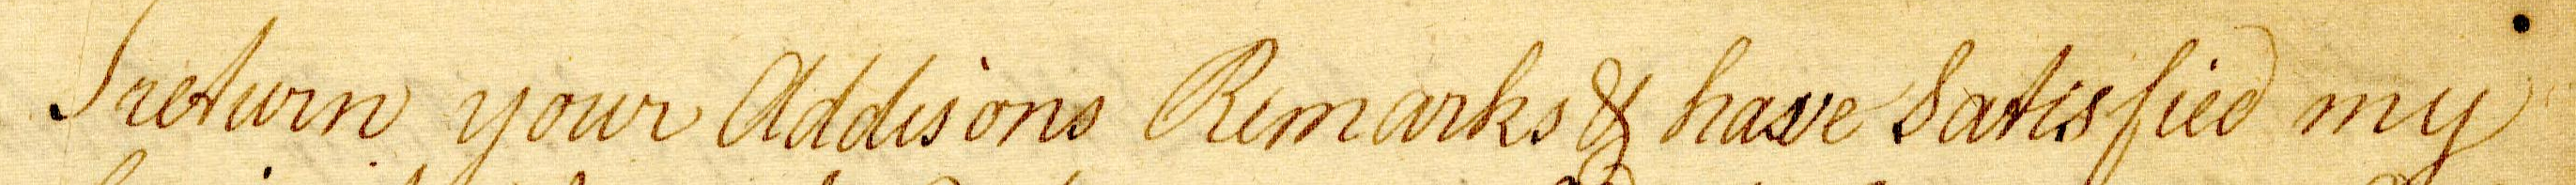I return your Addisons Remarks & have Satisfied my
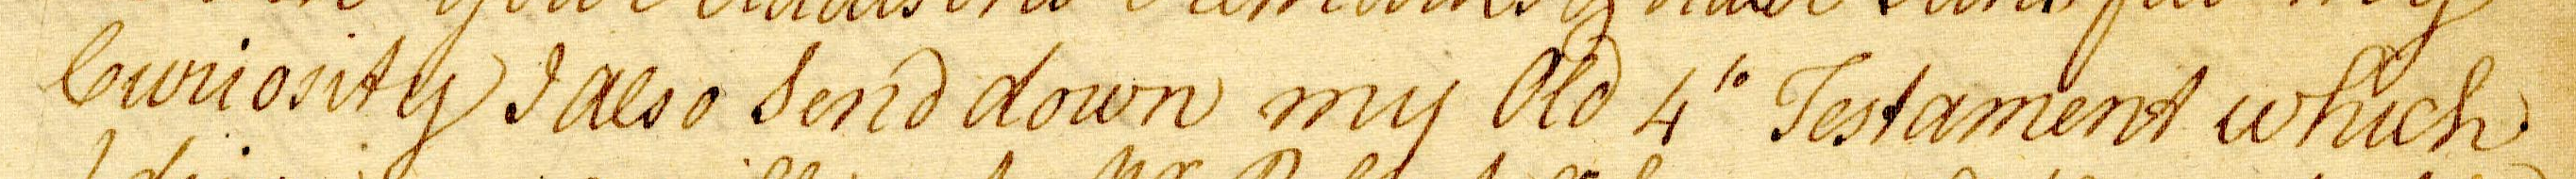Curiosity I also send down my Old 4^to Testament which
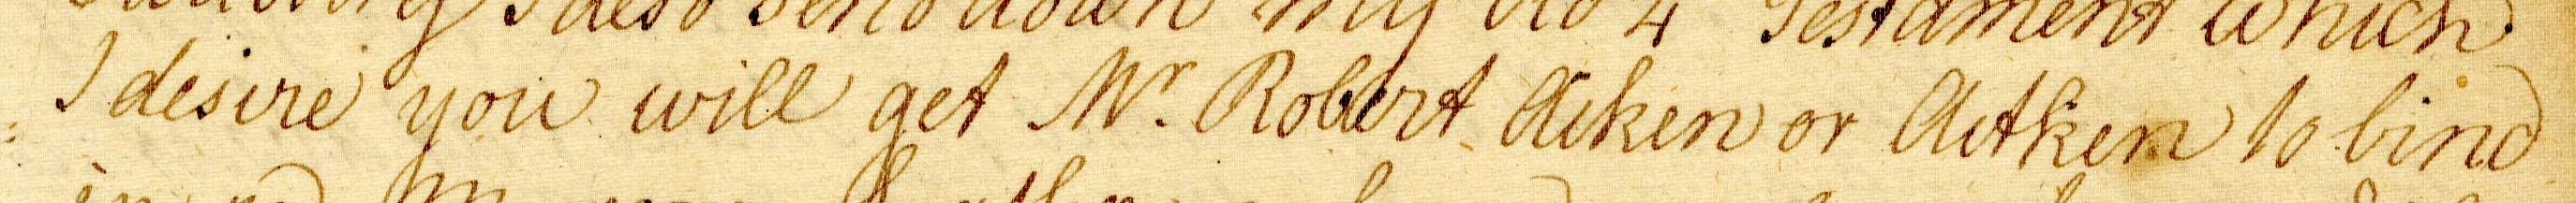I desire you will get M^r. Robert Aitken or Aitken to bind
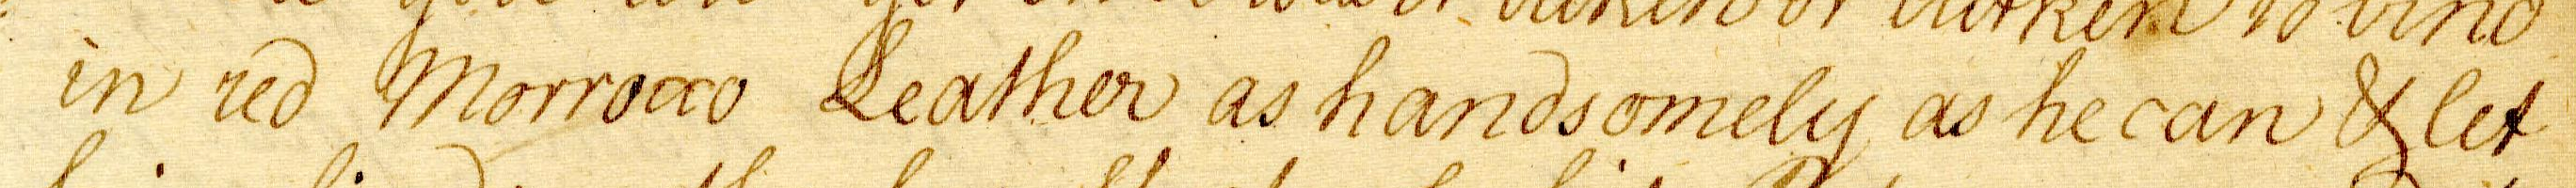in red Morrocco Leather as handsomely as he can & let
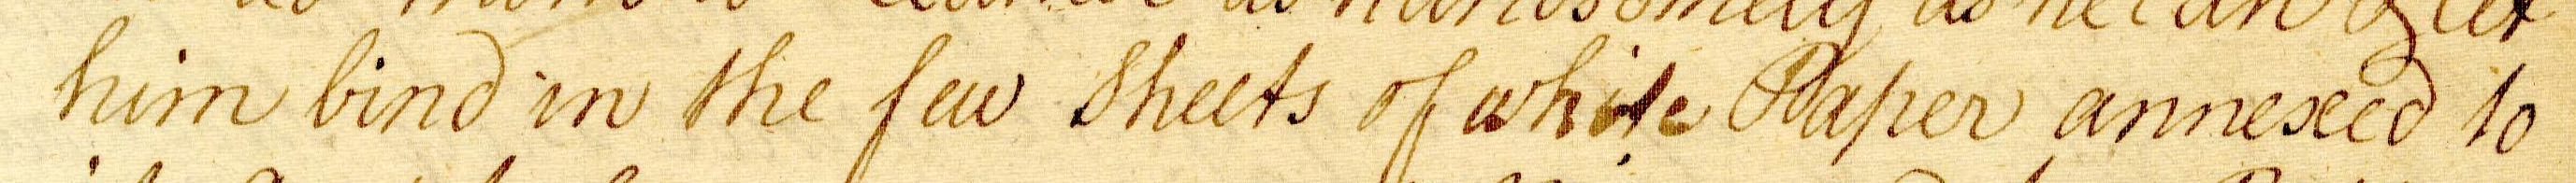him bind in the few Sheets of white Paper annexed to
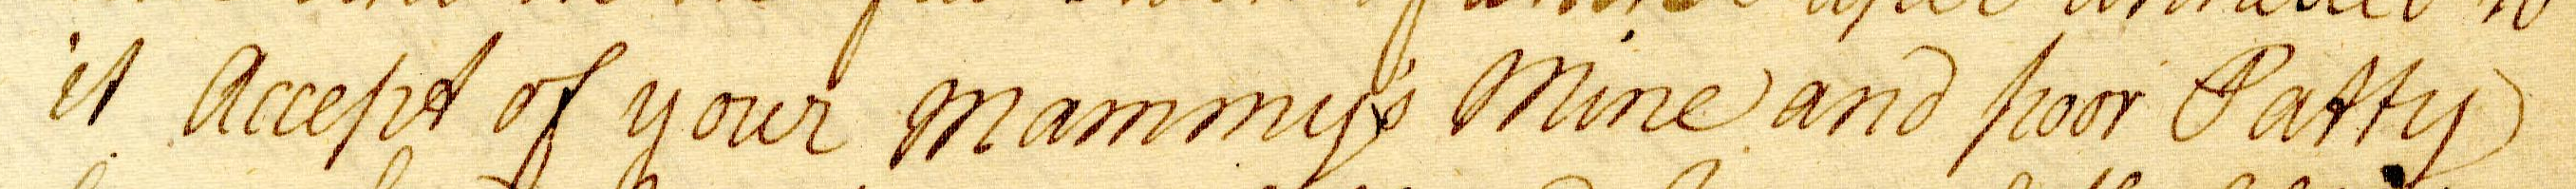it Accept of your Mammy's Mine and poor Patty
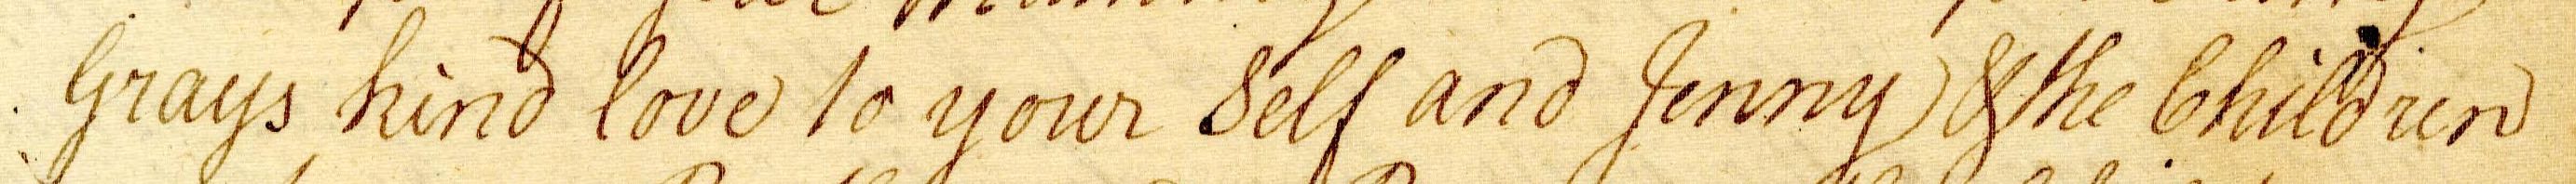Grays kind love to your Self and Jenny & the Children
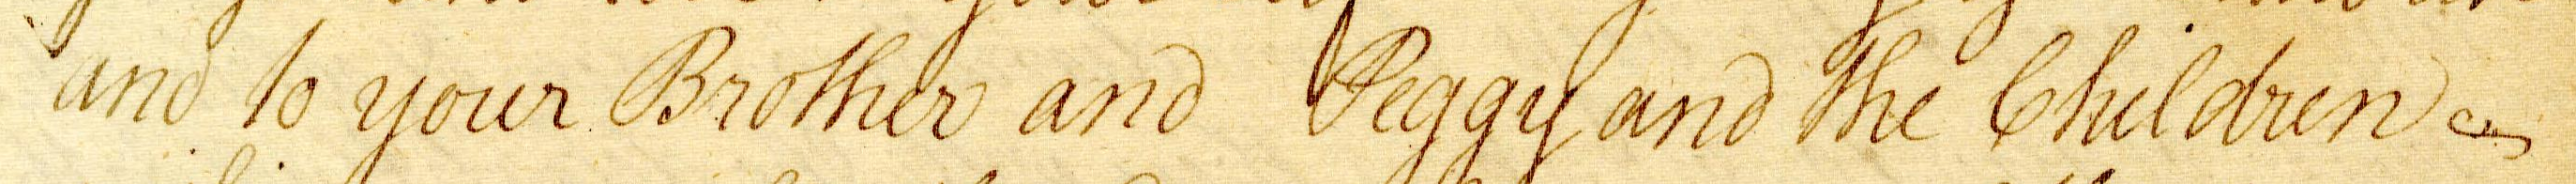and to your Brother and Peggy and the Children-
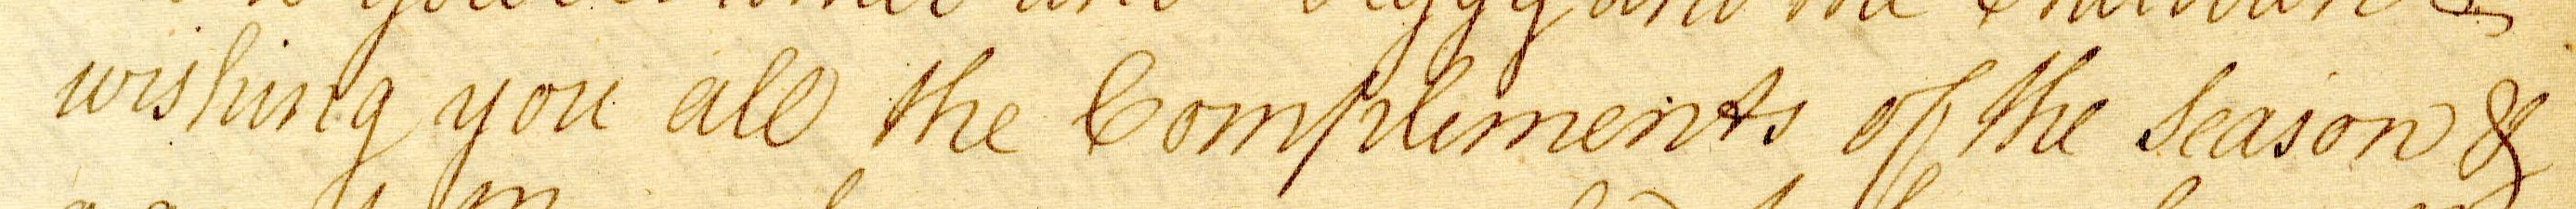wishing you all the Compliments of the Season &
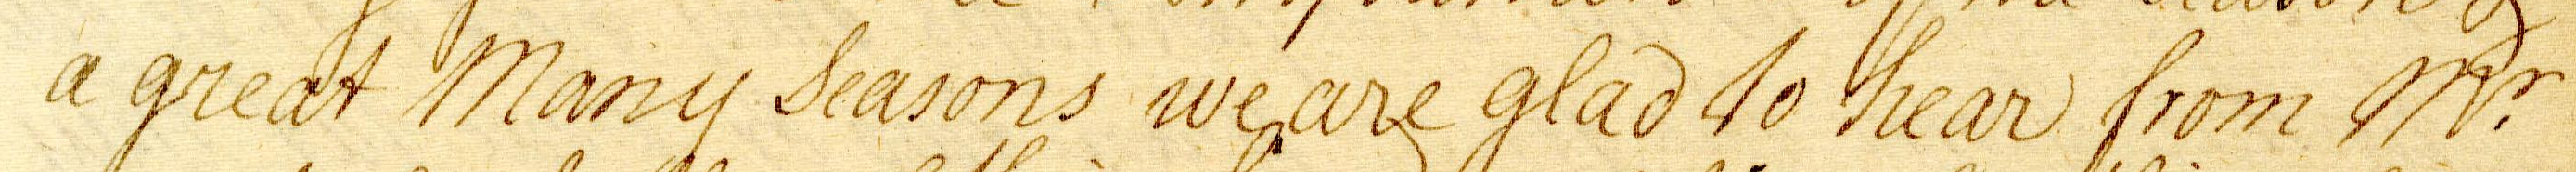a great Many Seasons we are glad to hear from M^r.
